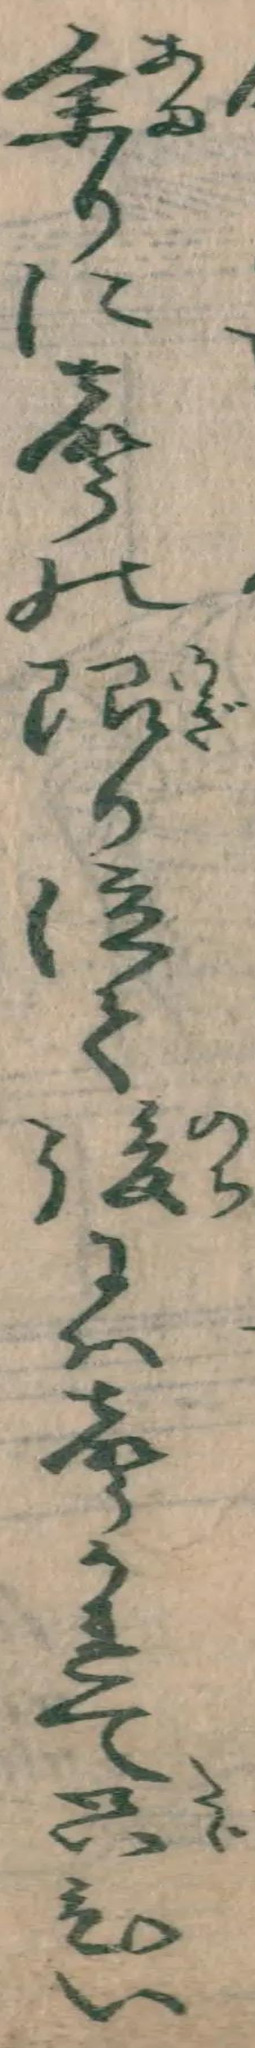余りに声の限り泣て後には声かれて只ひい
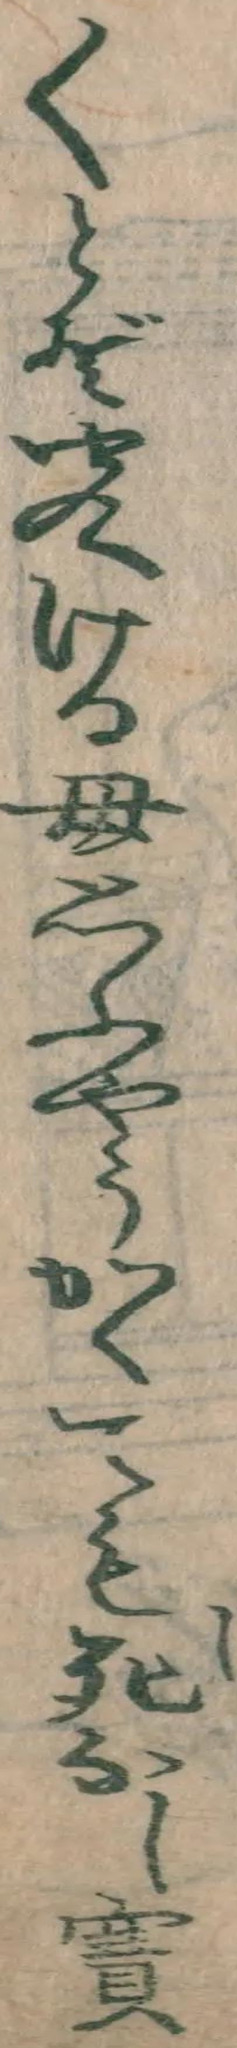〳〵とぞ聞へける母思ふやうかくても死なし賽
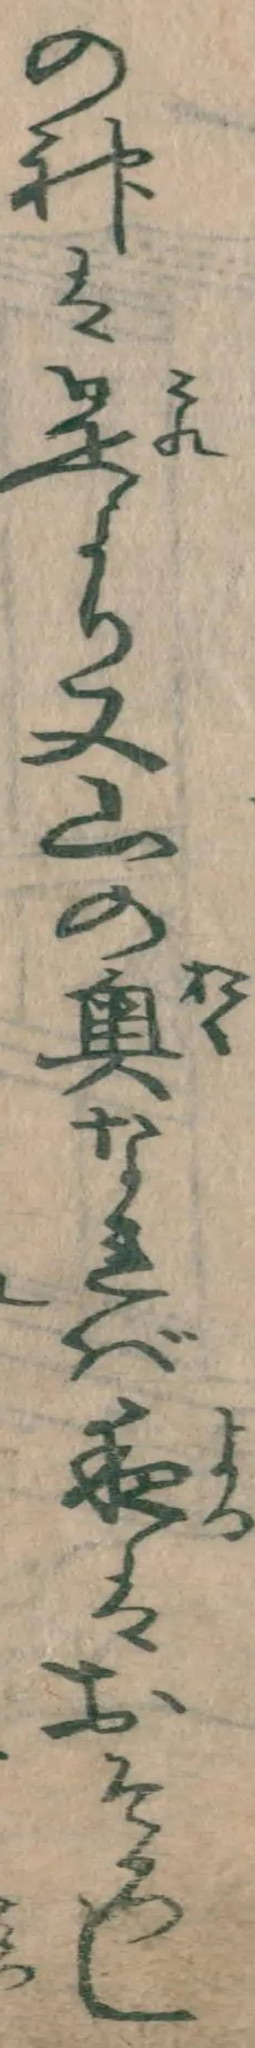の神は是より又山の奥なれば夜はおそろし
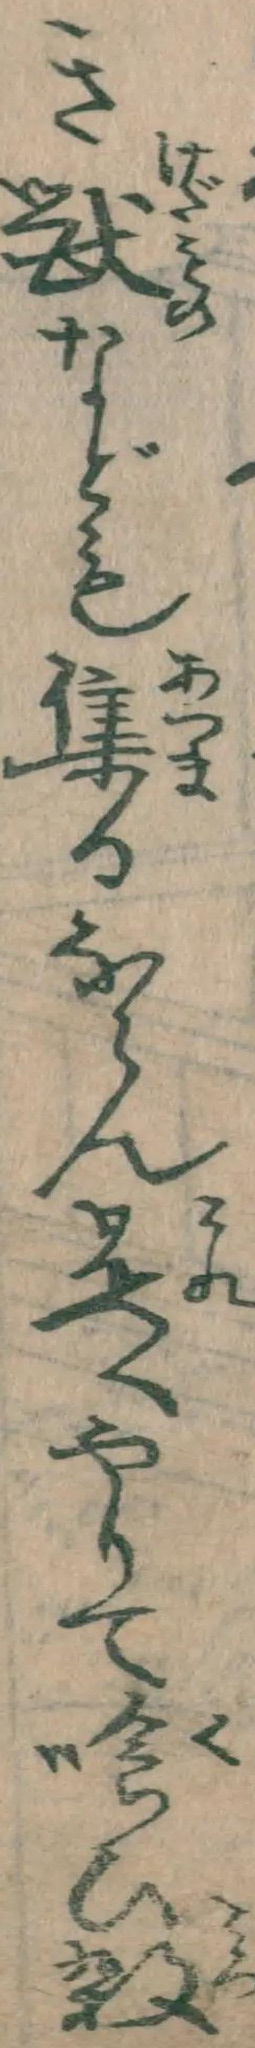き獣なども集るならん是へやりて喰らひ殺

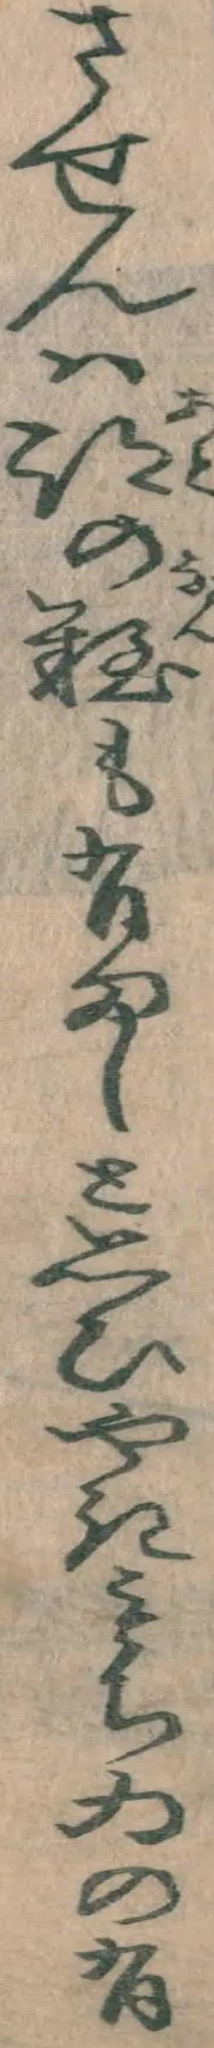させんは跡の難も有ましと思ひやきもちゐの有
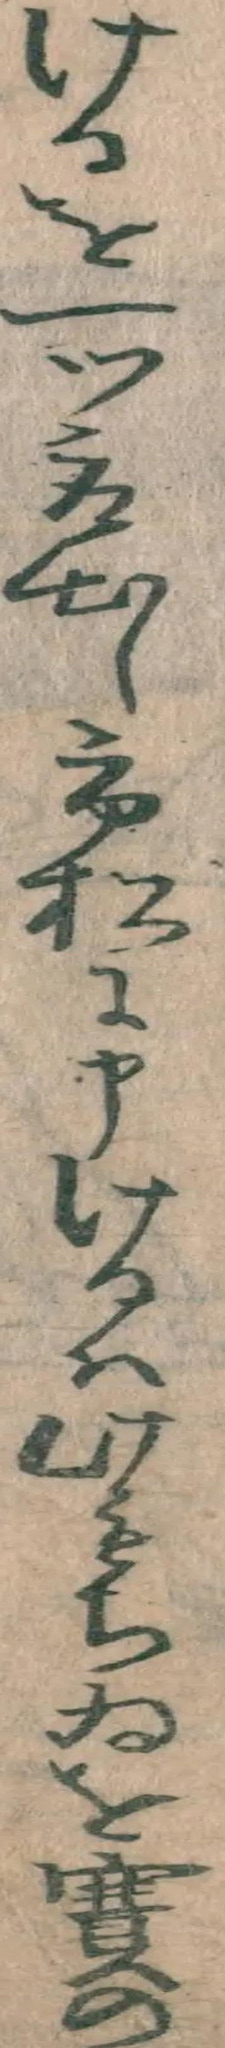けるを一つ取出し市松に申しけるは此もちゐを賽の
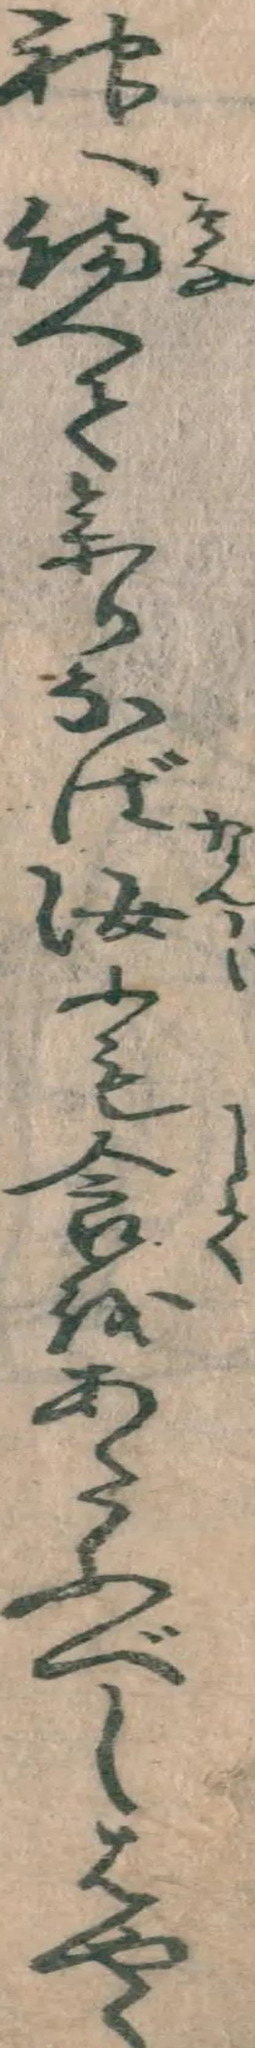神へ備へて参りなば汝にも食をあたふべしはやく
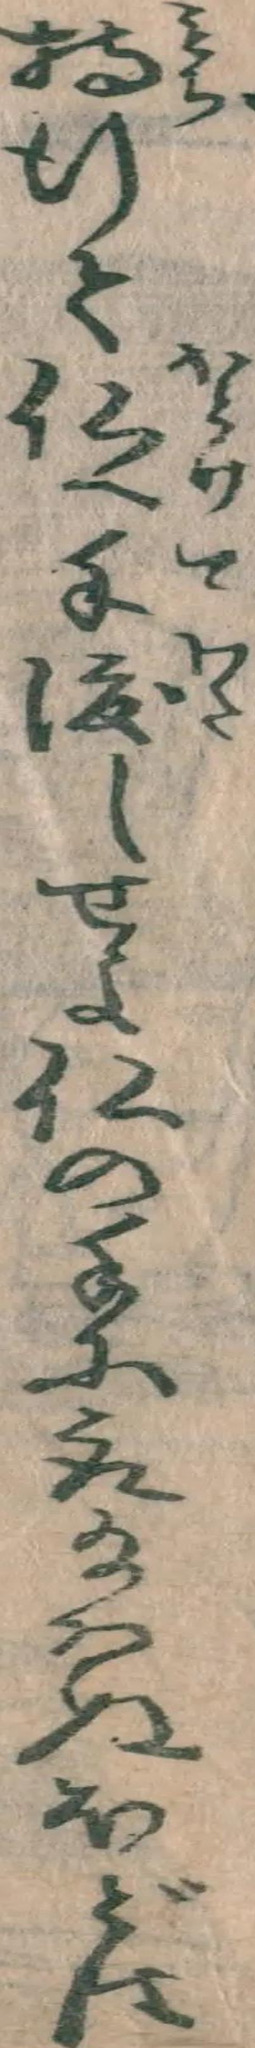持行て仏へ手渡しせよ仏の手に取給はぬほどは
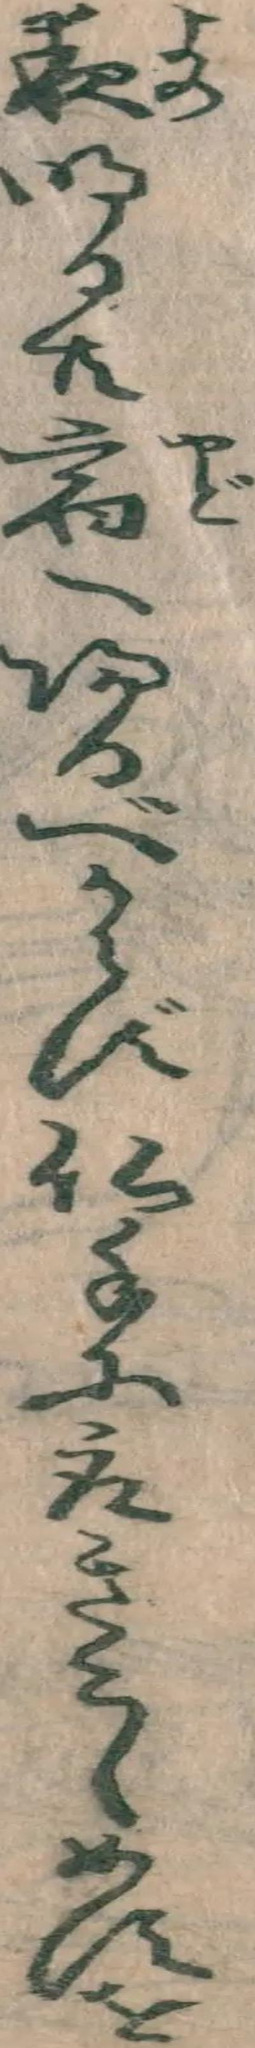夜明る共宿へ帰るべからず仏手に取きこしめすを
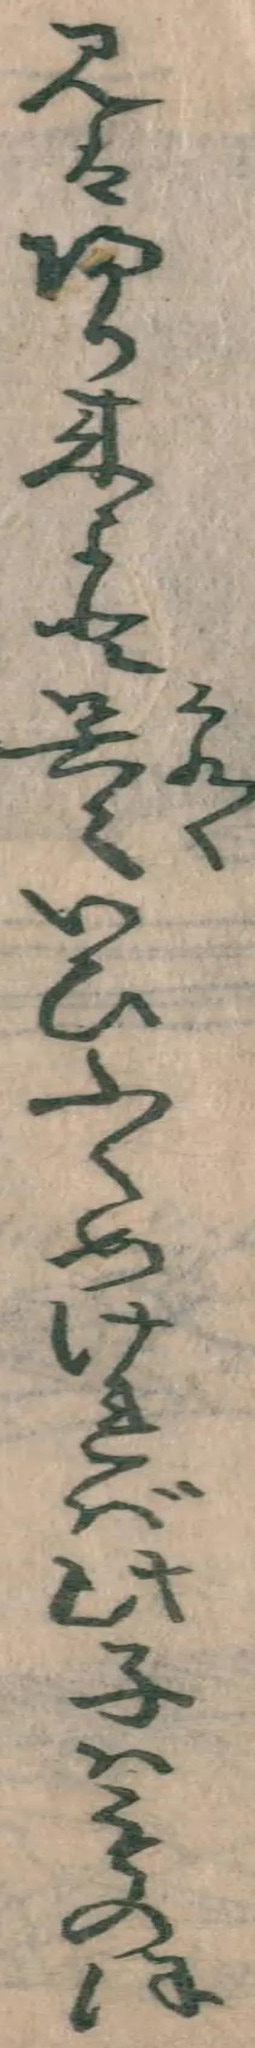見は帰り来よと呉ゝいひふくめければ此子はものほ
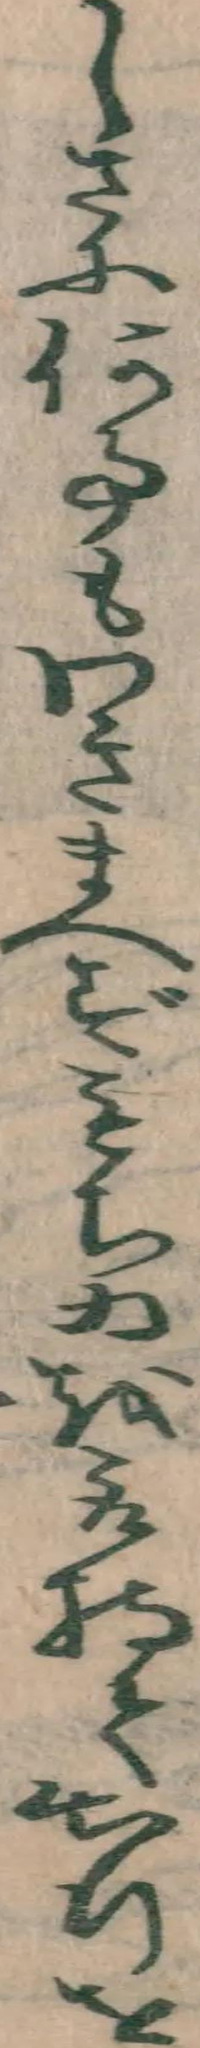しさに何事もわきまへずもちゐを取持て出行を
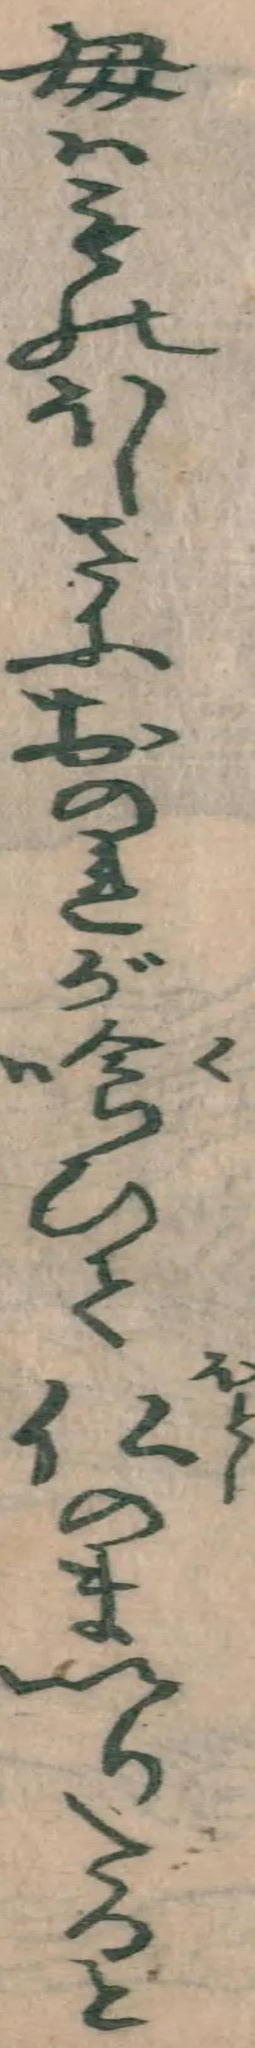母はものほしさにおのれが喰ひて仏のまいりたるを
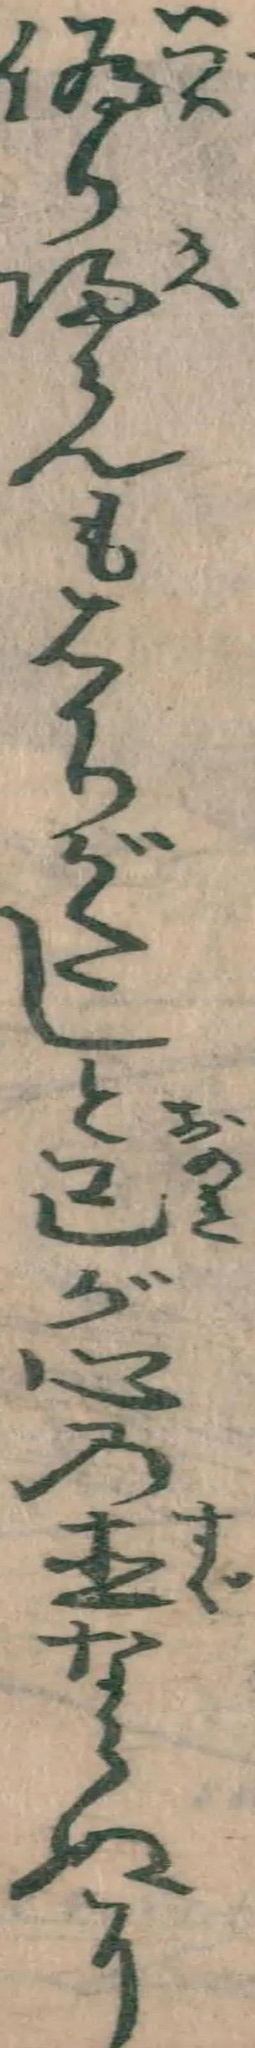偽り帰らんもはかりがたしと己が心の直ならぬに
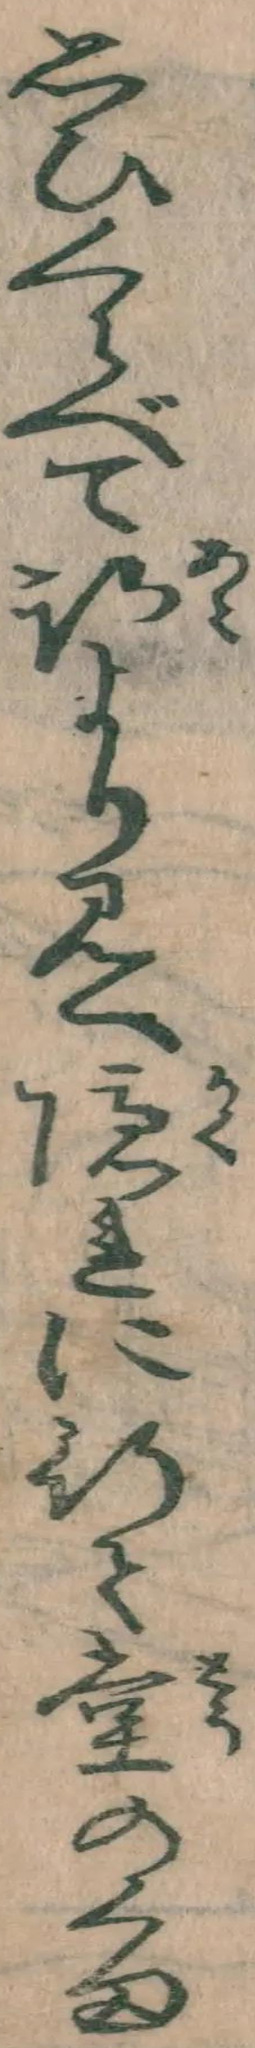思ひくらべて跡より見へ隠れに行て堂のくま
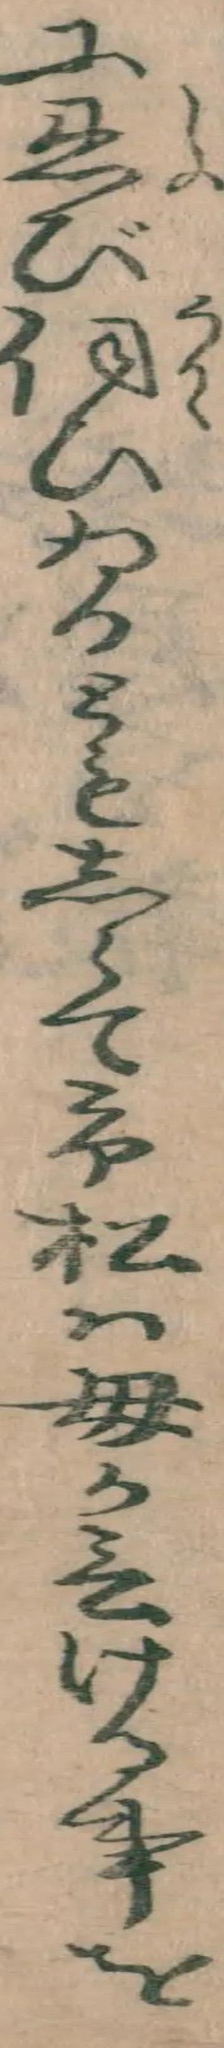に忍び伺ひゐるともしらて市松は母か言ける事を
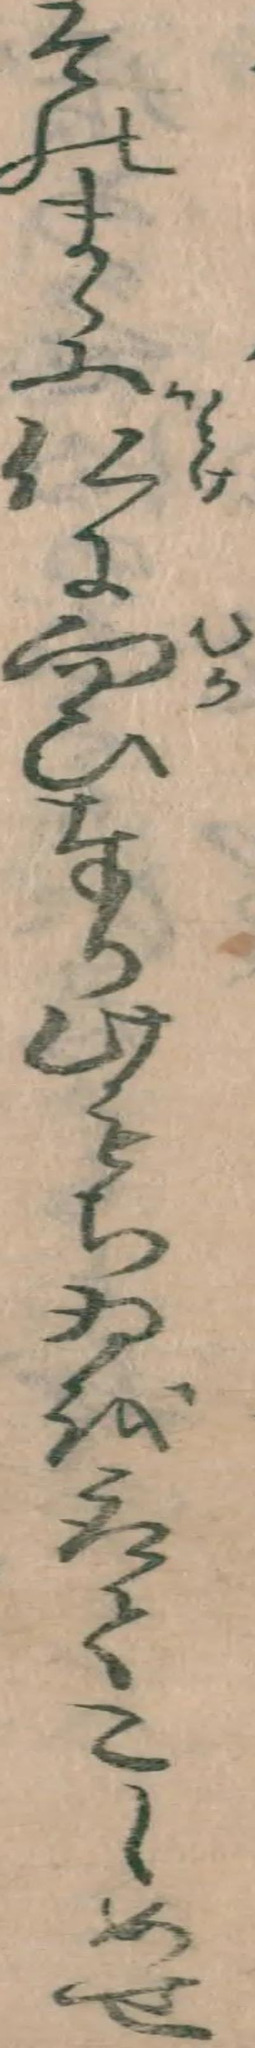そのまゝに仏に向ひ奉り此もちゐを取てこしめせ
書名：怪談御伽童 5巻. [1]
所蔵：国立国会図書館 National Diet Library, JAPAN
